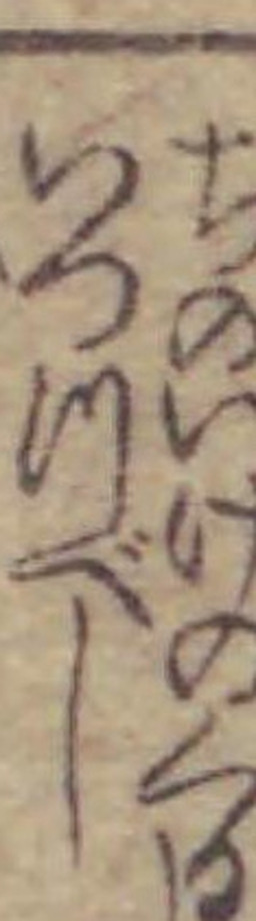いつ川べし
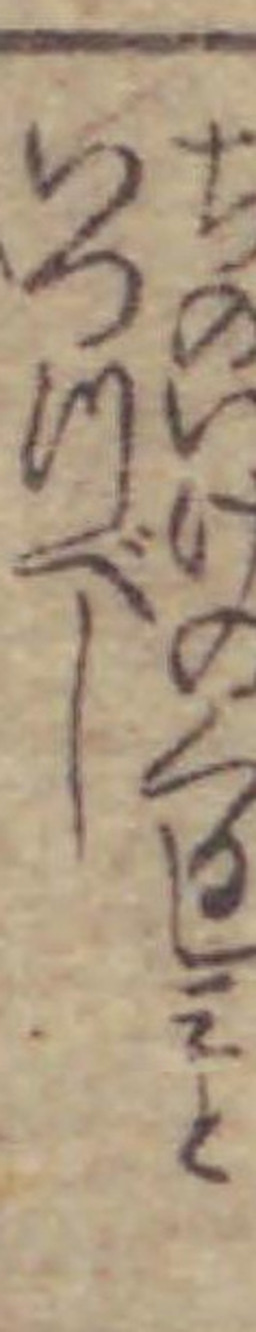いつ川べし
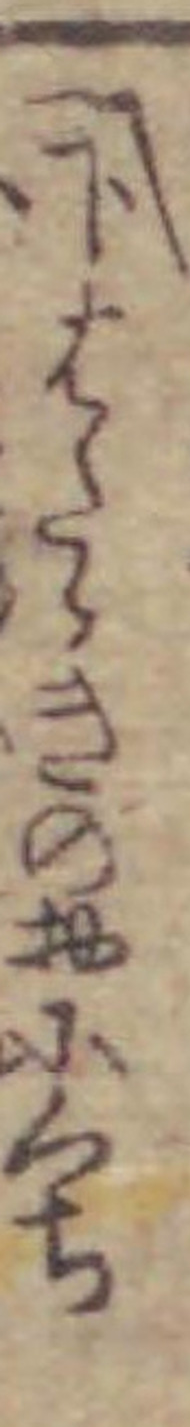「下はたらきのおにくち
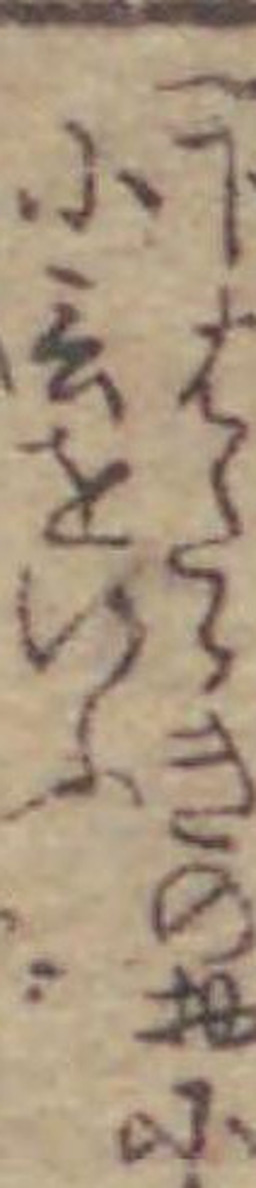小言をいふ
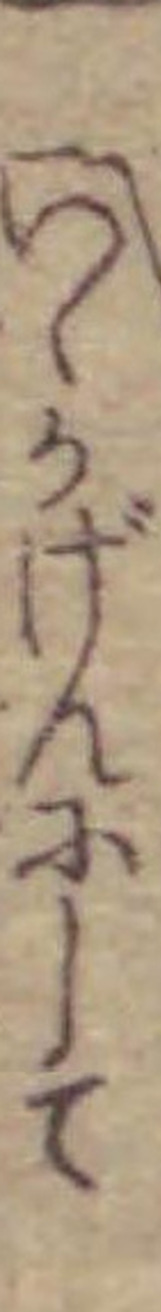「いゝかげんにして
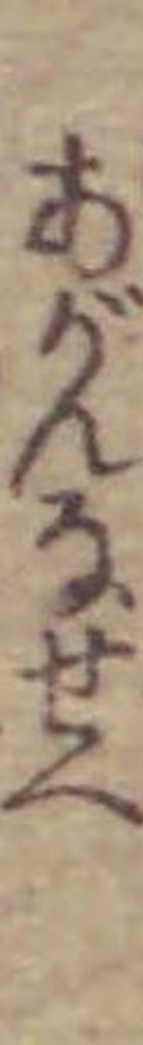あがんなせへ
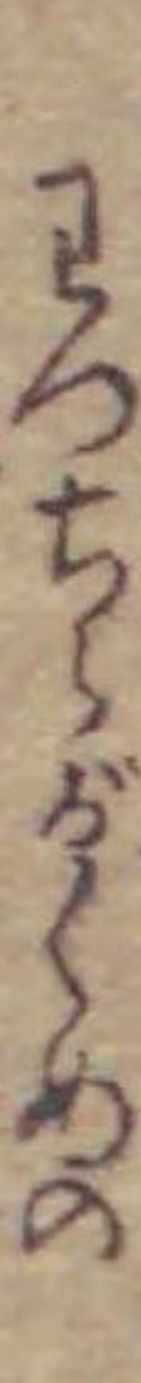わつちらがくめの
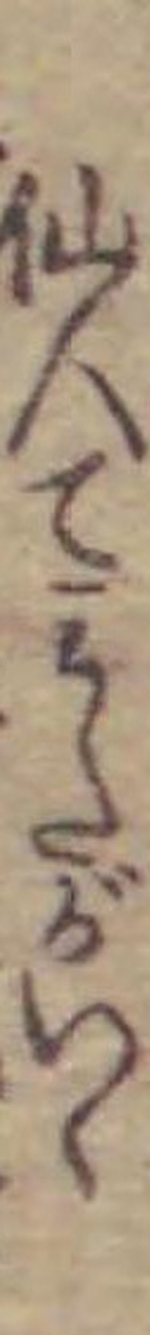仙人てみたがいゝ
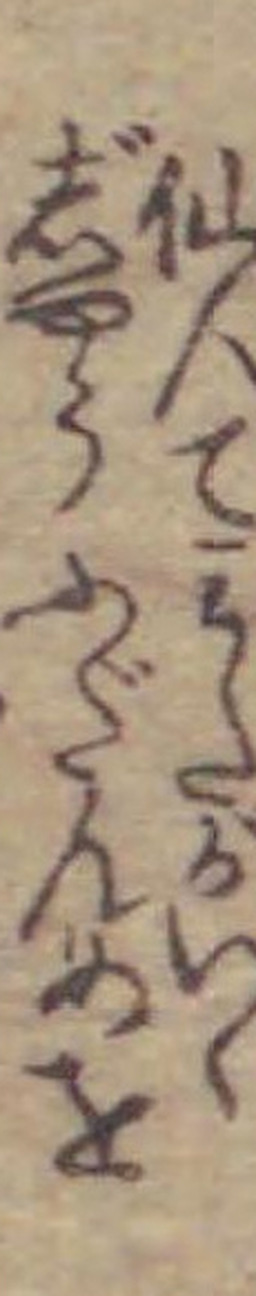じやうふだんめを
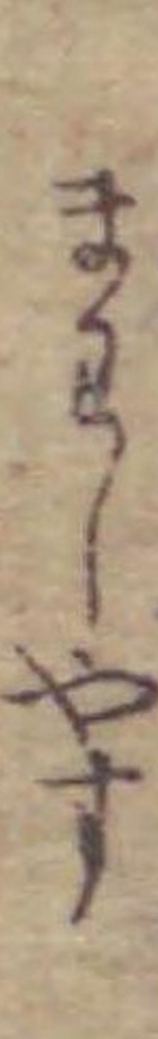まわしやす

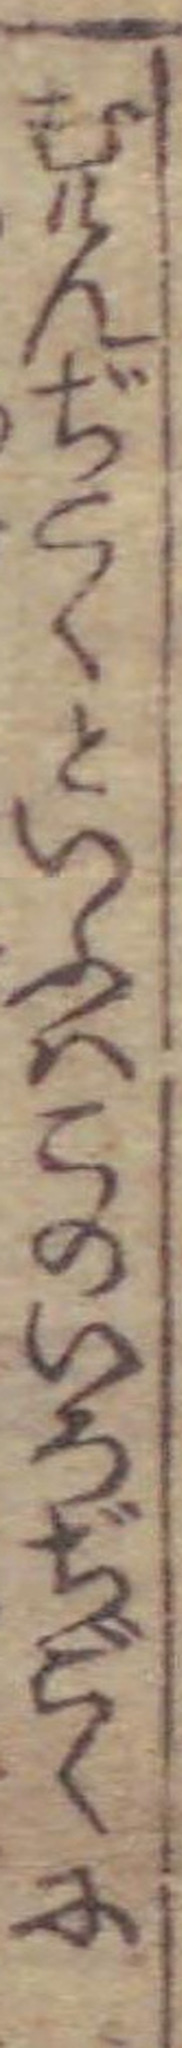むけんぢこくといふはこのいろぢごくに
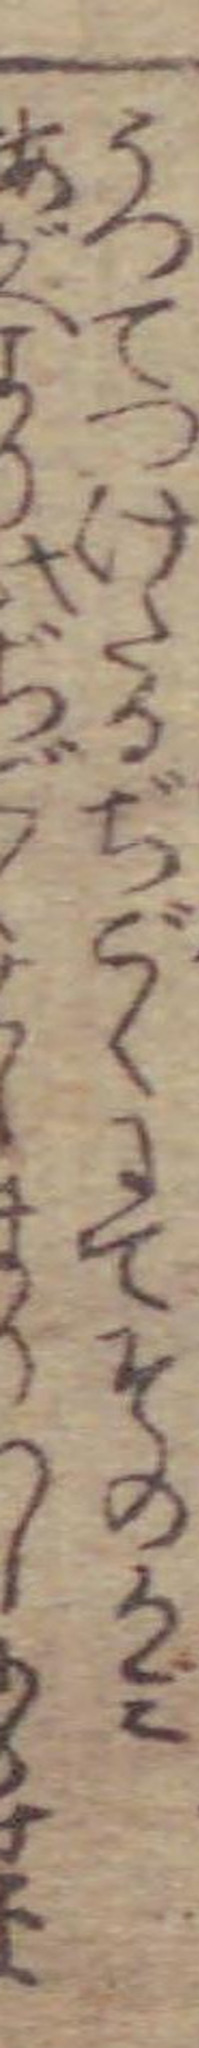梅がへより此ぢごくはしまりいしにもせよ
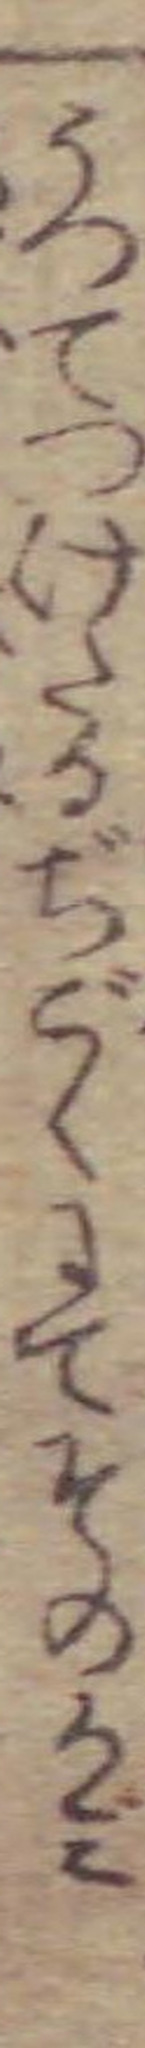うつてつけたるぢごくにてそのかみ
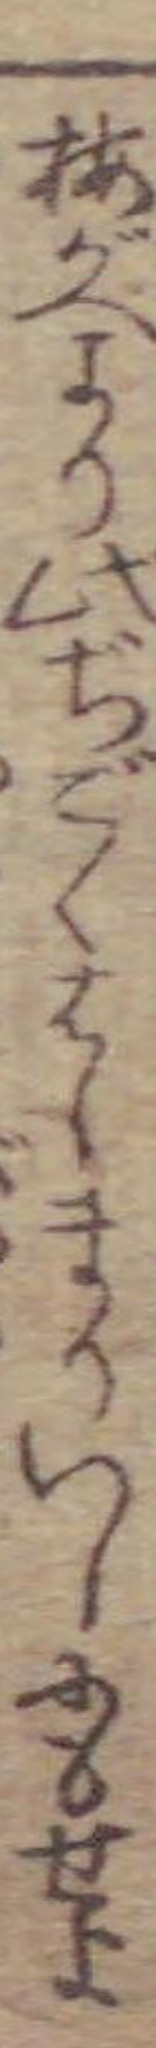梅がへより此ぢごくはしまりいしにもせよ
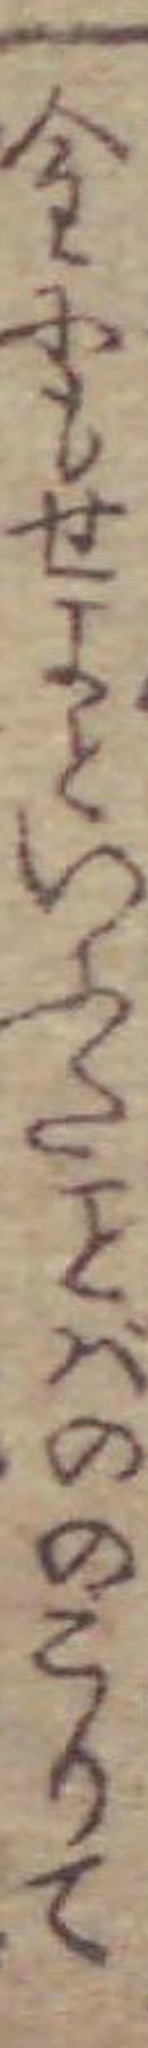金にもせよといふたことばののこりて
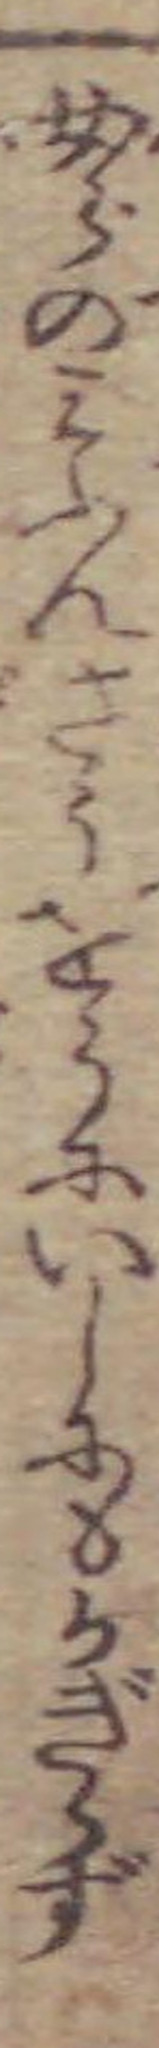女郎のみふんさうをうにいしにもかぎらず
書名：九替十年色地獄 : 3巻
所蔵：国立国会図書館 National Diet Library, JAPAN
